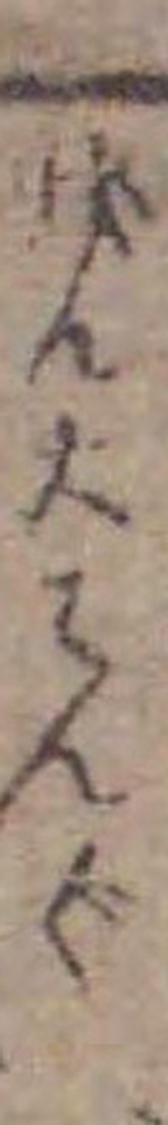げん大てんぐ
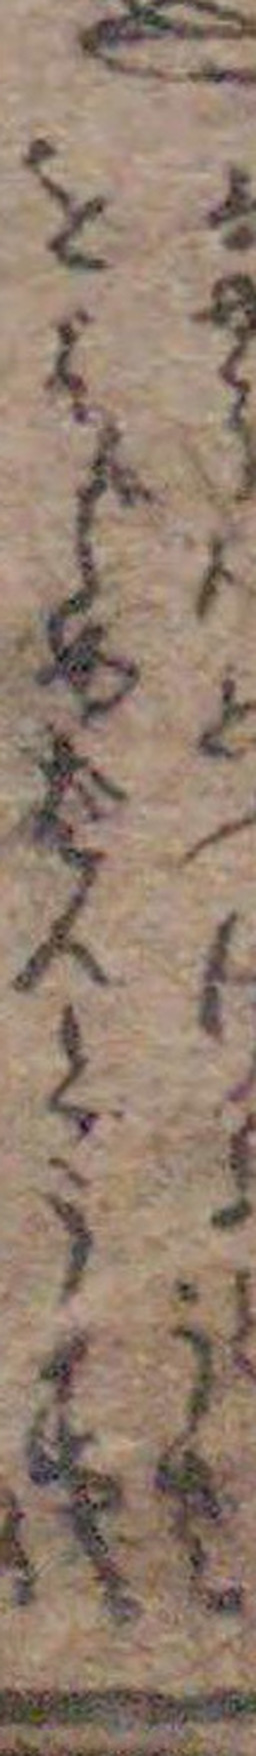をはじめばんとう手代
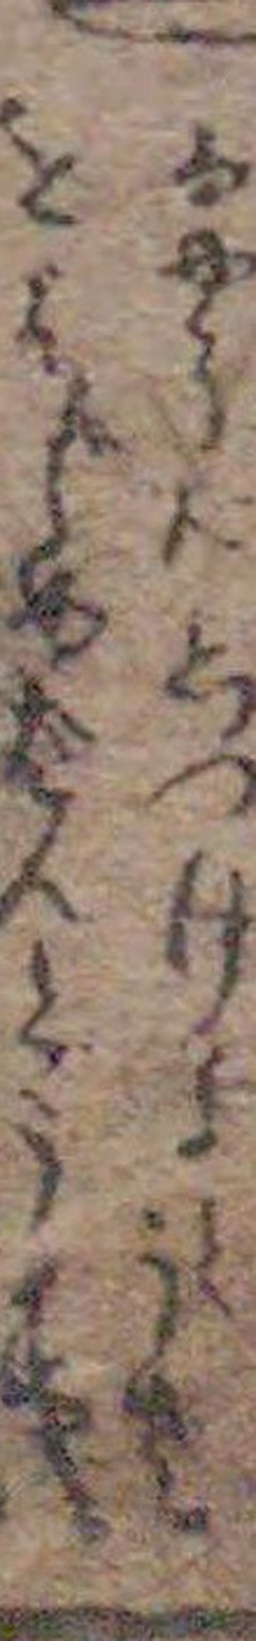をはじめばんとう手代
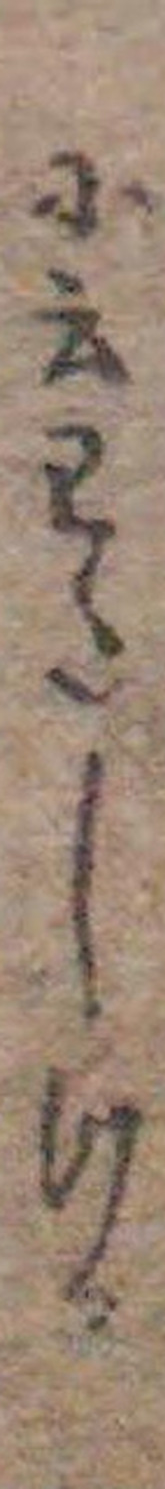に云わたしける

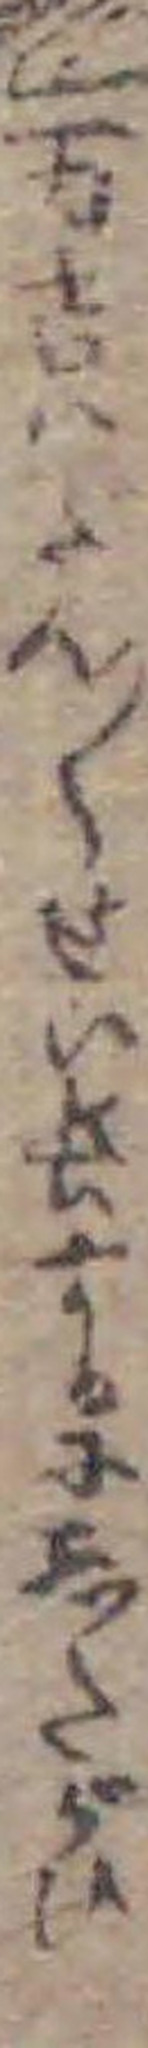万吉はだん〳〵せい長するにしたがひ
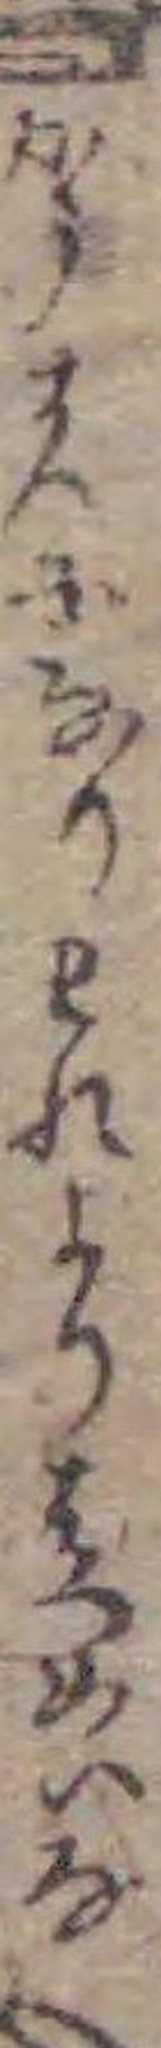かうあんになりわれよりはつめいな
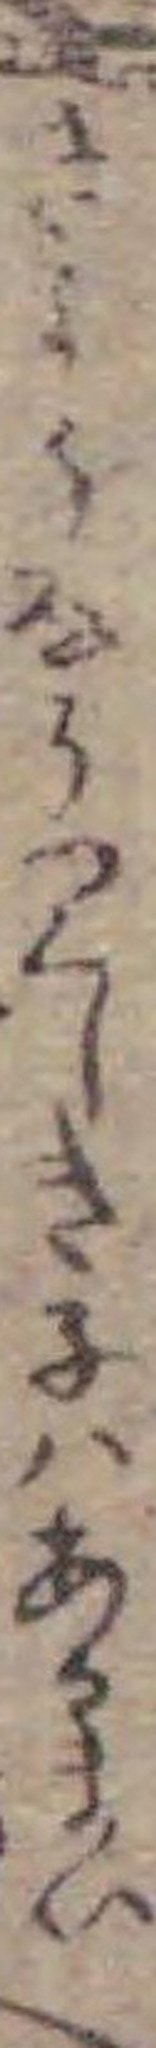きようなうつくしき子はあるまい
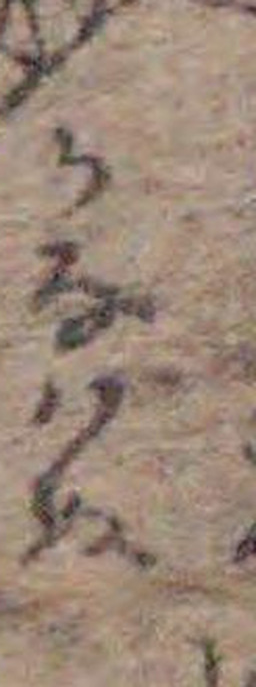かなはぬ
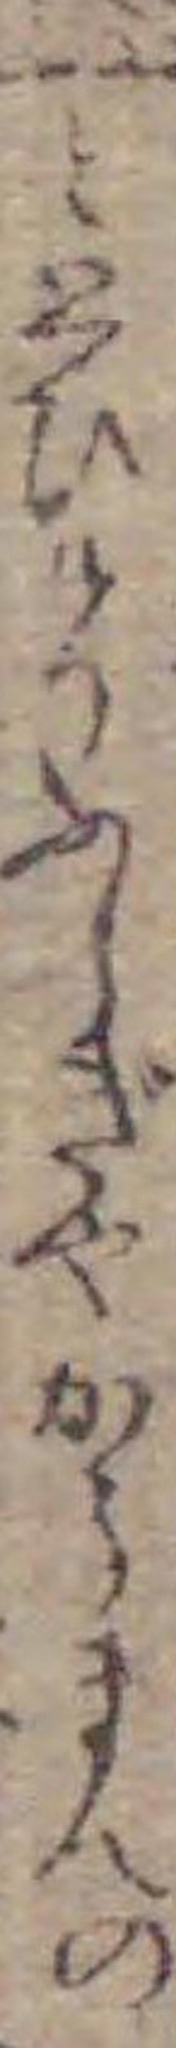と思ひけりふしぎやかうまんの
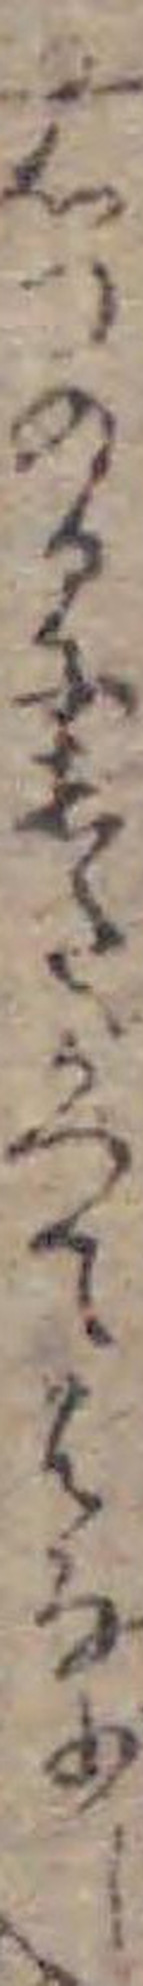心つのるにしたがつてはな少し
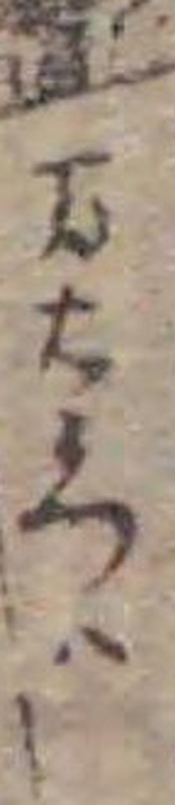万右衛門は
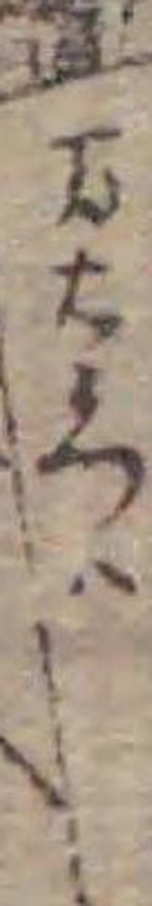万右衛門は
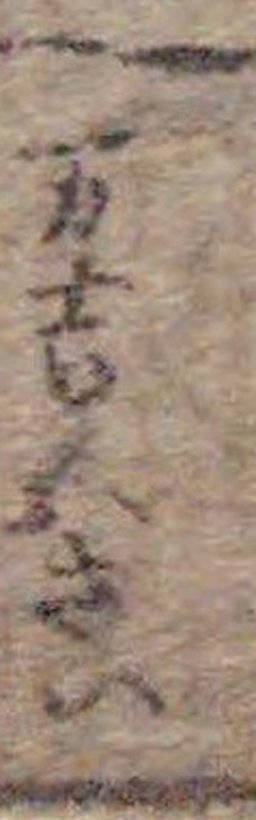万吉五さい
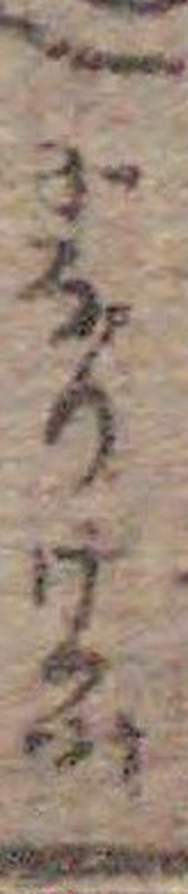になりけるに
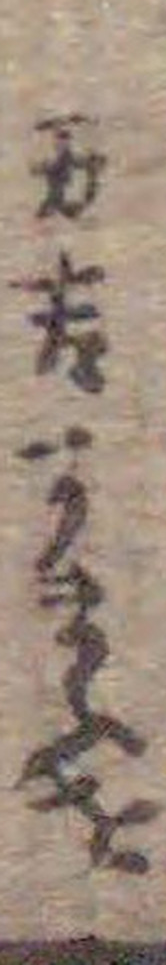万吉すまふを
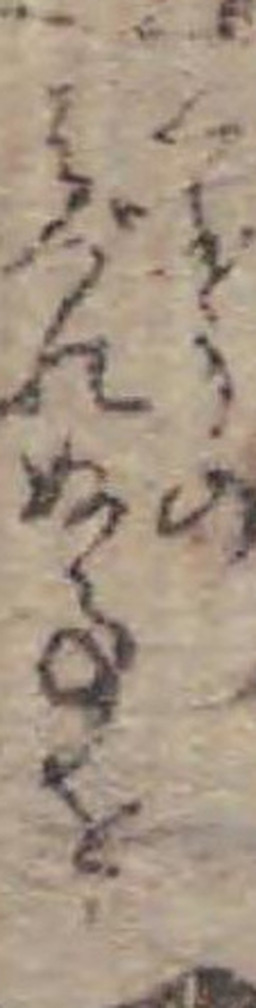はづれぬ事を
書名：鼻峰高慢男 : 2巻
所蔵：国立国会図書館 National Diet Library, JAPAN
